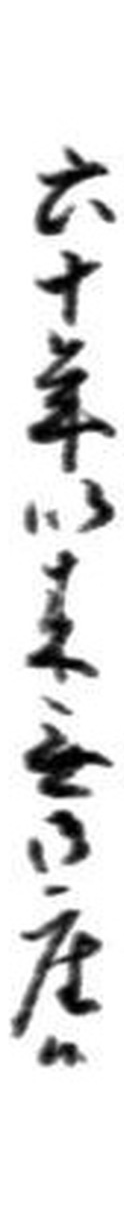六十年以来無御座候
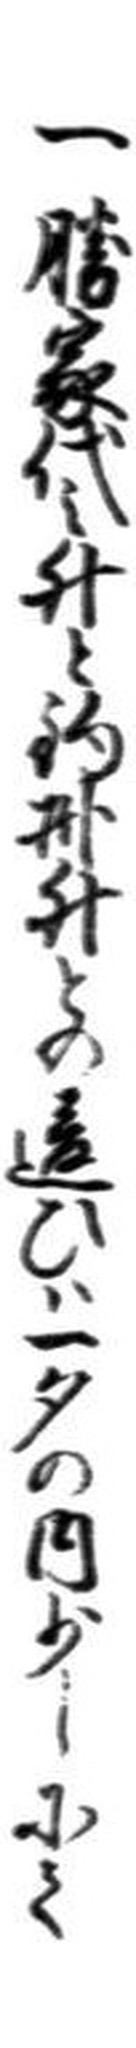一勝家代之升と釣掛升との違ひハ一夕の内少しにて
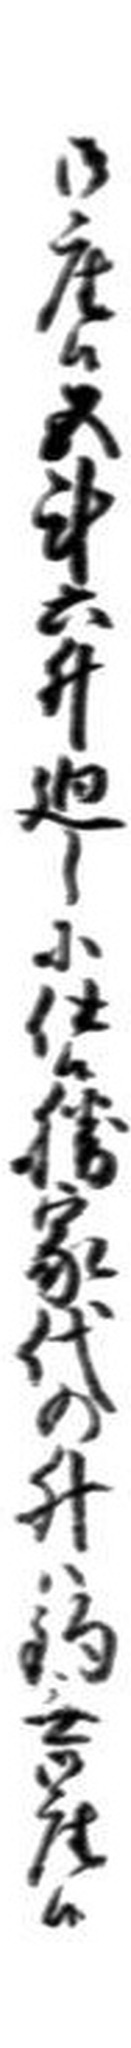御座候五斗六升廻しに仕候勝家代の升ハ釣無御座候
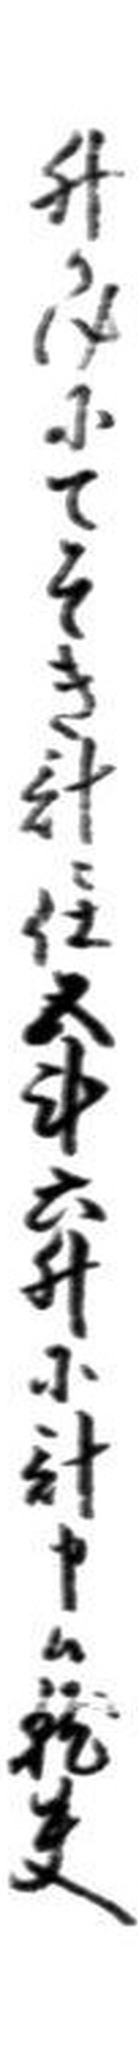升かけにてそき計ニ仕五斗六升に計申候就夫

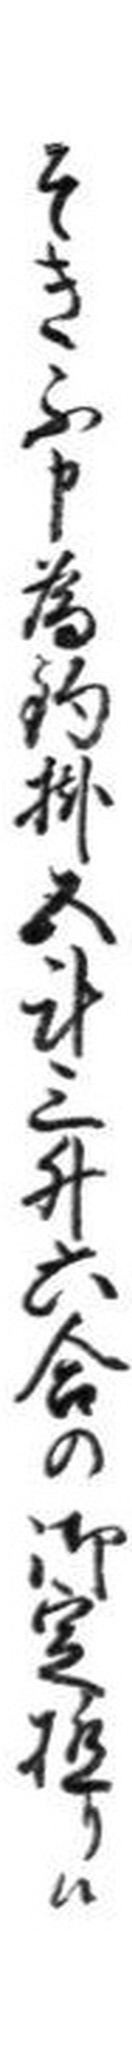そき不申為釣掛五斗三升六合の御定極リ候
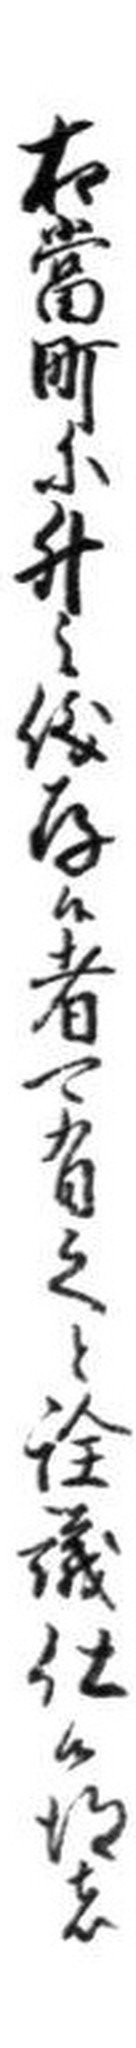右当町に升之儀存候者可有之と詮議仕候得者
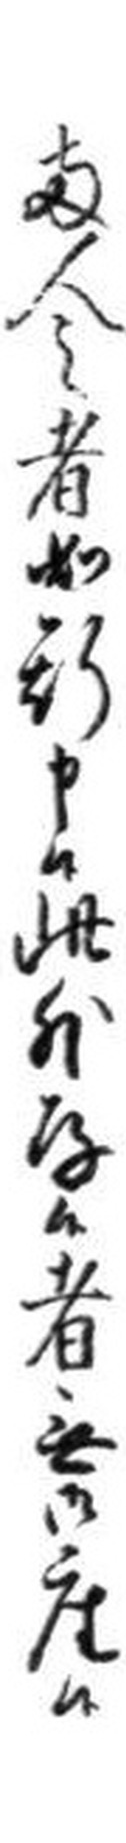両人之者如斯申候此外存候者無御座候
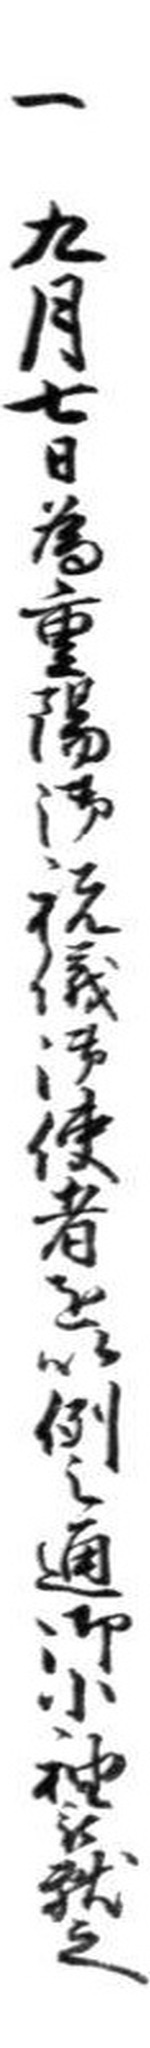一九月七日為重陽御祝儀御使者を以例之通御小袖被献之
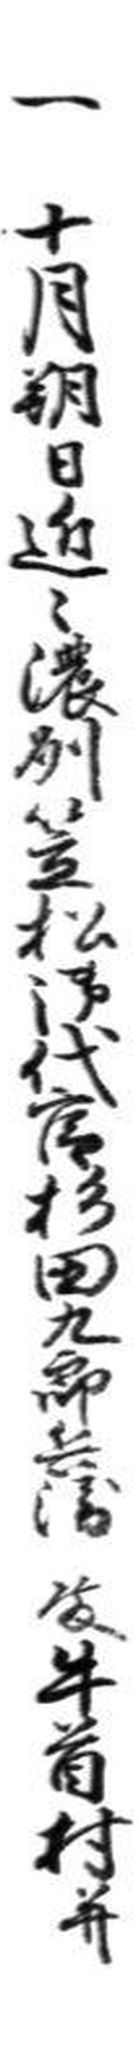一十月朔日近々濃州笠松御代官杉田九郎兵衛殿牛首村幷
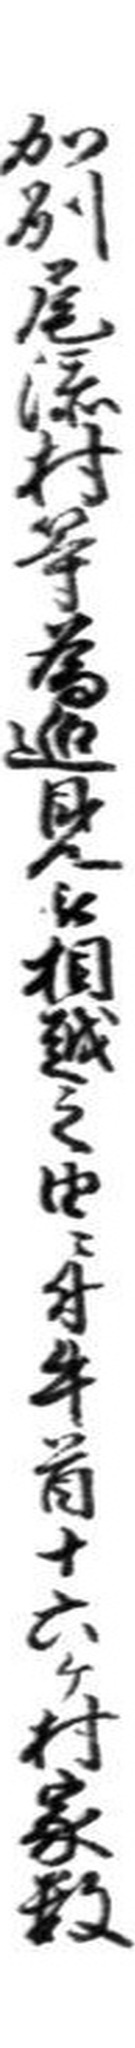加州尾添村等為巡見被相越之由ニ付牛首十六ヶ村家数
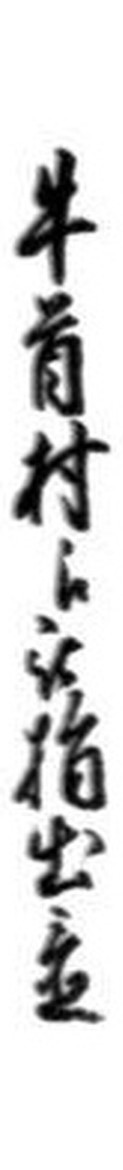牛首村江被指出置
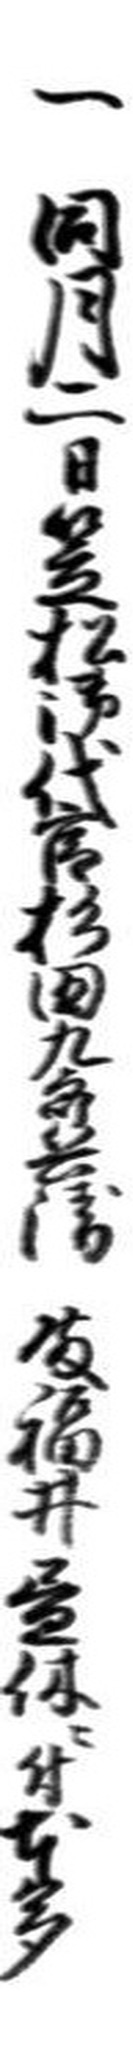一同月二日笠松御代官杉田九郎兵衛殿福井昼休ニ付本多
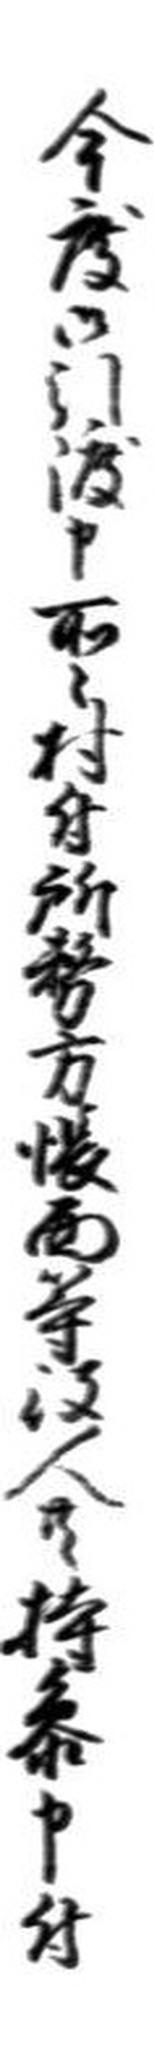今度御引渡申所々村付所務方帳面等役人共持参申付
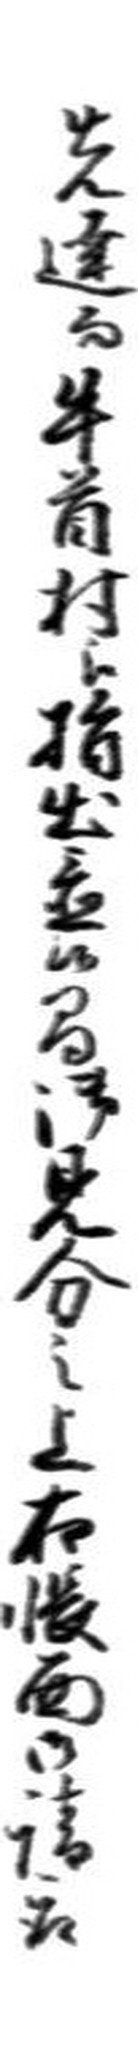先達而牛首村江指出置候間御見分之上右帳面御請取
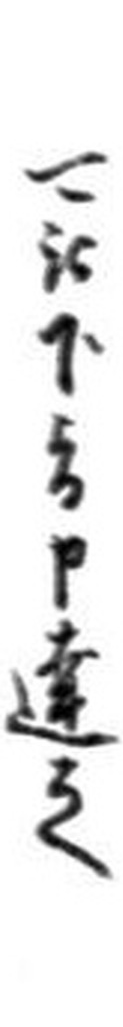可被下旨申達之

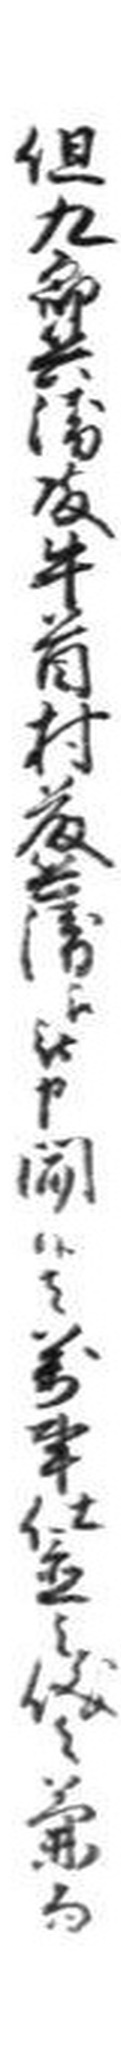但九郎兵衛殿牛首村藤兵衛江被申聞候者万事仕置之儀者兼而
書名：家譜 七 光通公 従寛文四年到同九年
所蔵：福井県文書館 Fukui Prefectural Archives
